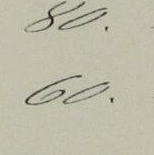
60
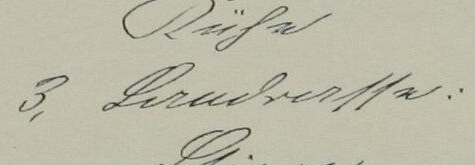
3. Landrasse:
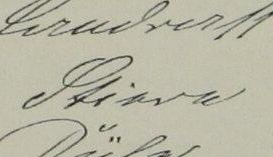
Stiere
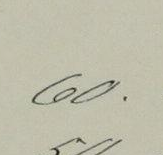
60
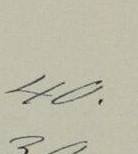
40
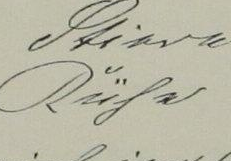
Kühe
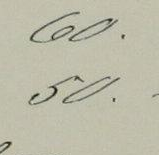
50
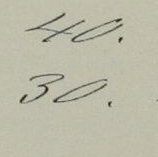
30
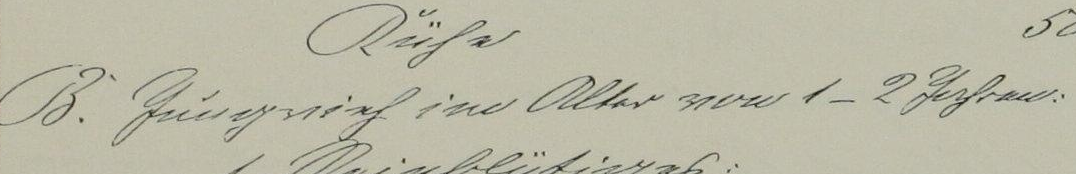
B. Jungvieh im Alter von 1-2 Jahren:
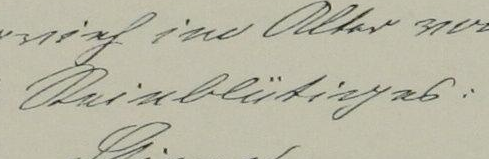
1. Reinblütiges:
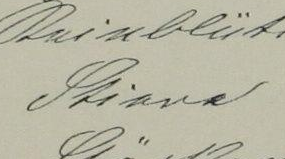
Stiere
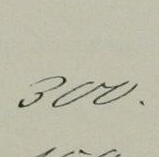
300
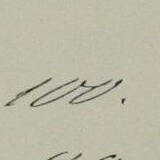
100
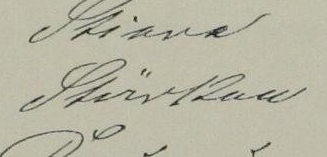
Stärken
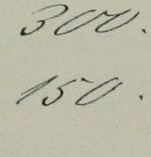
150
